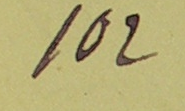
102
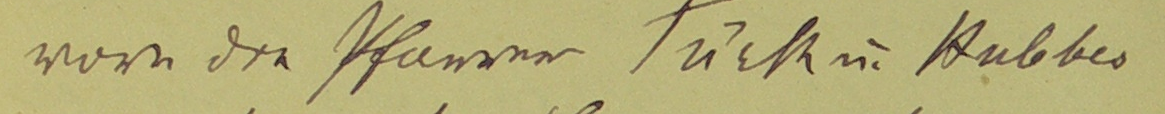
vorn die Pfarrer Türk und Hubbes
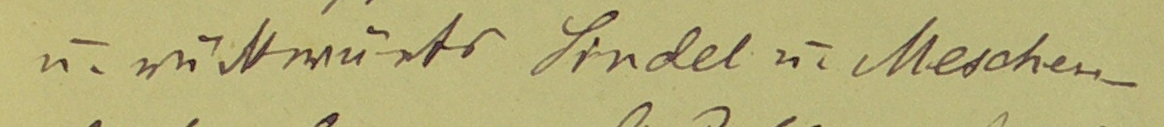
und rückwärts Sindel und Meschen¬
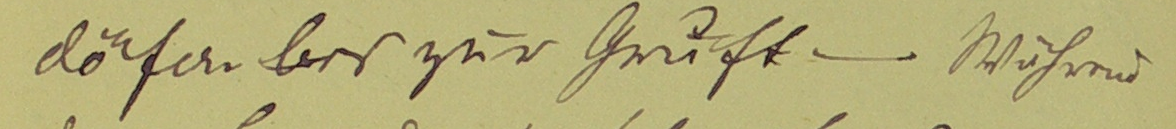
dörfer bis zur Gruft. Während
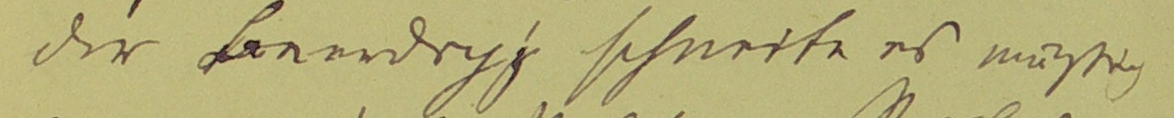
der Beerdigung schneite es mäßig
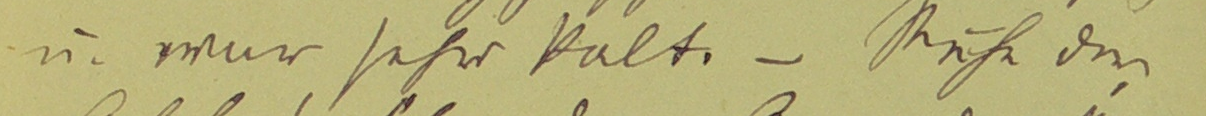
und war sehr kalt. Ruhe deiner
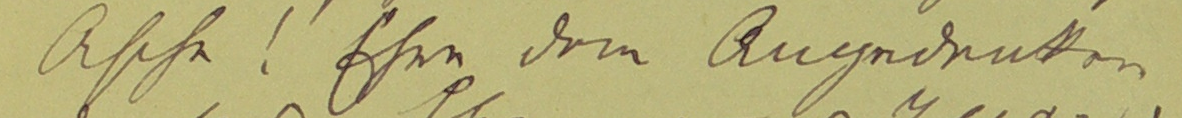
Asche ! Ehre dem Angedenken
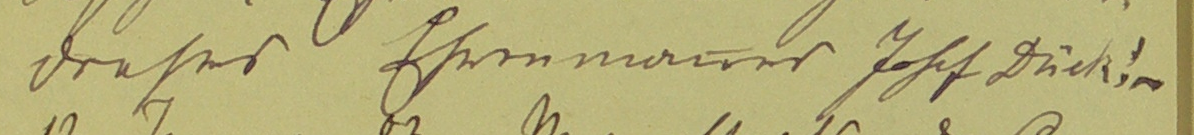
dieses Ehrenmannes Josef Dück.—
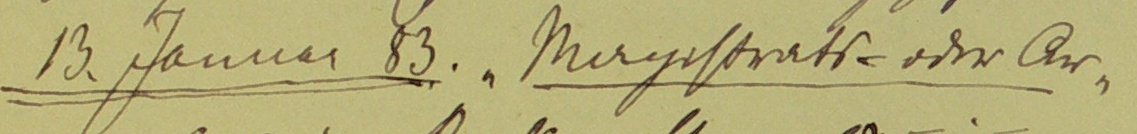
13. Januar 83. „Magistrats oder Ar¬
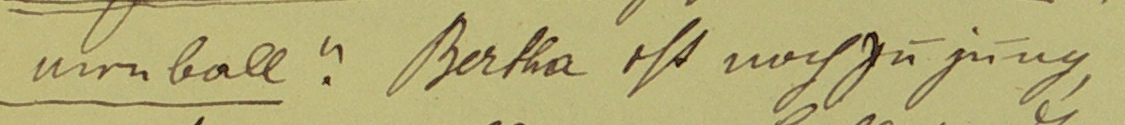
menball.“ Bertha ist noch zu jung
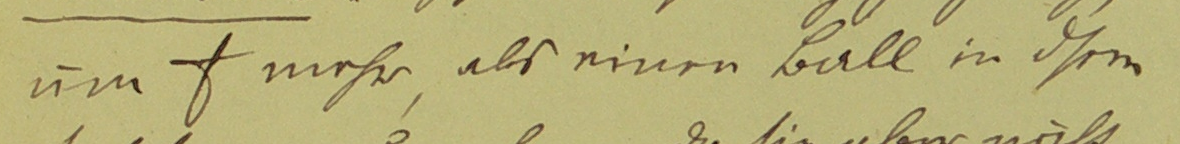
um auf mehr als einem Ball in diesem
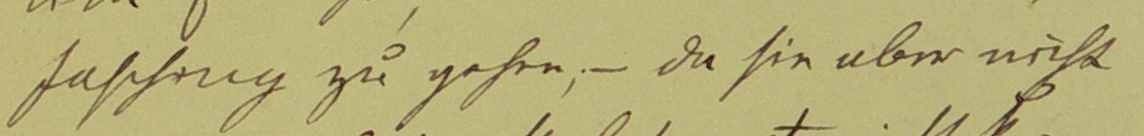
Fasching zu gehen,-Da sie aber nicht
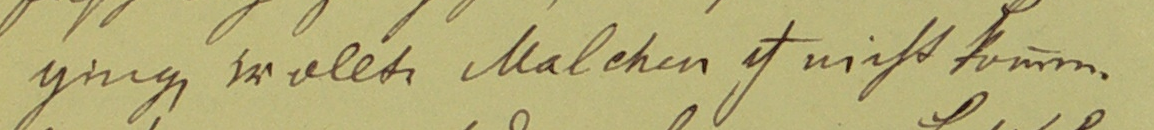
ging wollte Malchen auch nicht kommen.
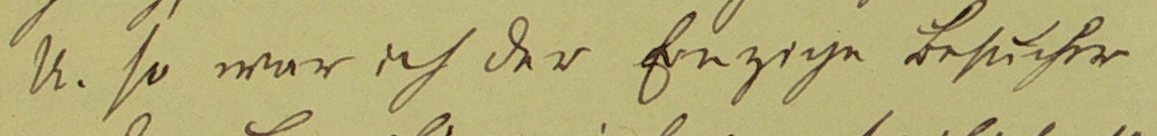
Und so war ich der einzige Besucher
